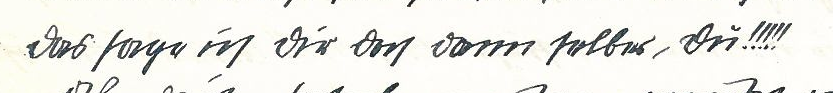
das sage ich Dir doch dann selber, Du!!!!!
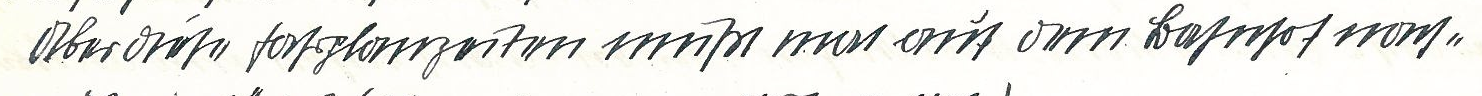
Aber diese Fahrplanzeiten mußt mal auf dem Bahnhof nach¬
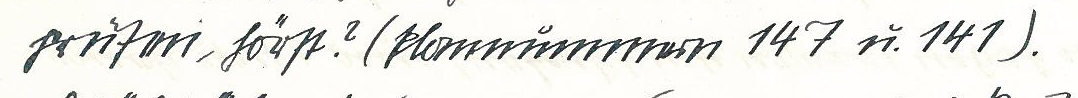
prüfen, hörst? (Plannummern u. )
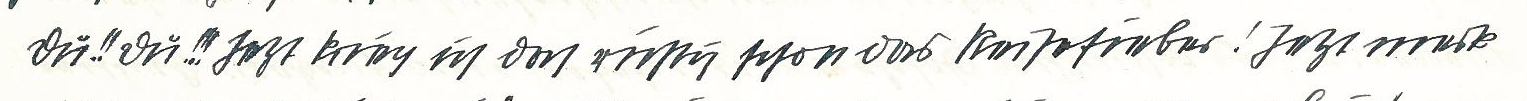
Du!! Du!!! Jetzt krieg ich doch richtig schon das Reisefieber! Jetzt merk
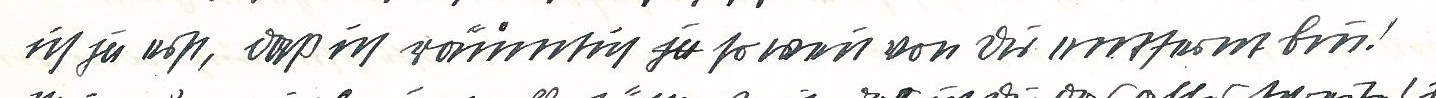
ich ja erst, daß ich räumlich ja so weit von Dir entfernt bin!
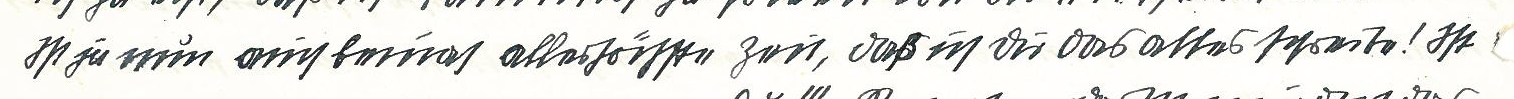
Ist ja nun auch beinah allerhöchste Zeit, daß ich Dir das alles schreibe! Ist
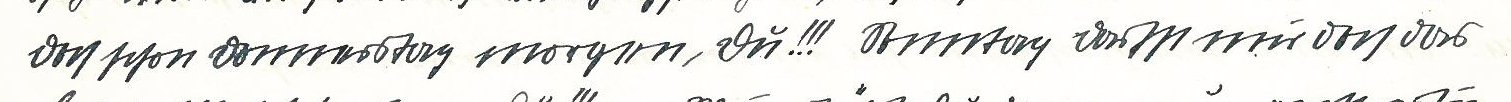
doch schon Donnerstag morgen, Du!!! Sonntag darfst mir doch das
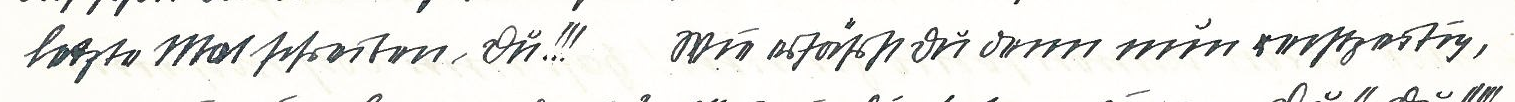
letzte Mal schreiben, Du!!! Wie erfährst Du denn nun rechtzeitig,
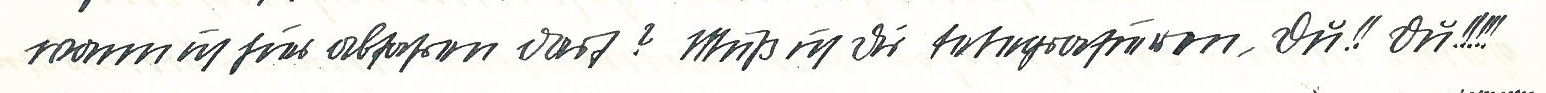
wann ich hier abfahren darf? Muß ich Dir telegrafieren, Du!! Du!!!!!
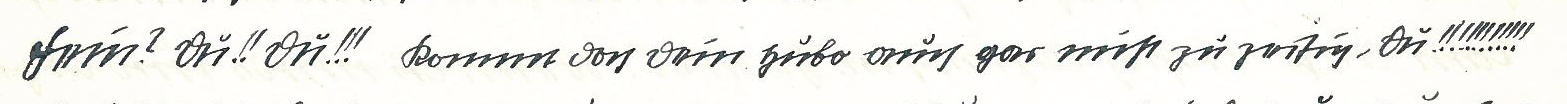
Fein? Du!! Du!!! Kommt doch Dein Hubo auch gar nicht zu zeitig, Du!!!!!!!!!!!
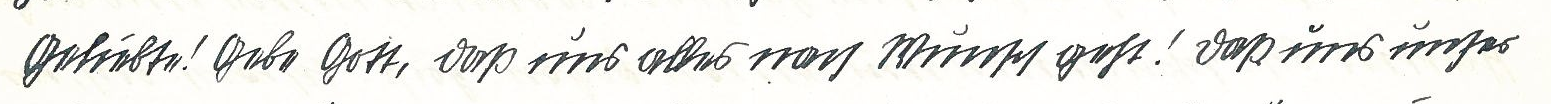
Geliebte! Gebe Gott, daß uns alles nach Wunsch geht! Daß unser
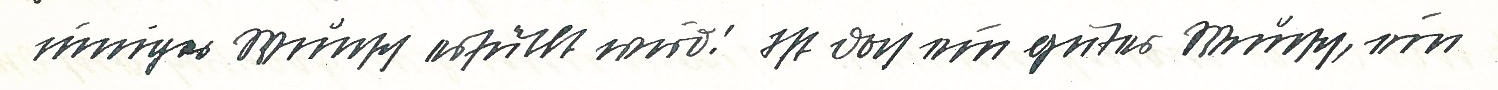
inniger Wunsch erfüllt wird! Ist doch ein guter Wunsch, ein
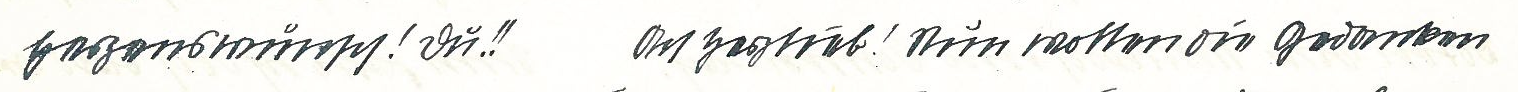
Herzenswunsch! Du!! Ach Herzlieb! Nun wollen die Gedanken
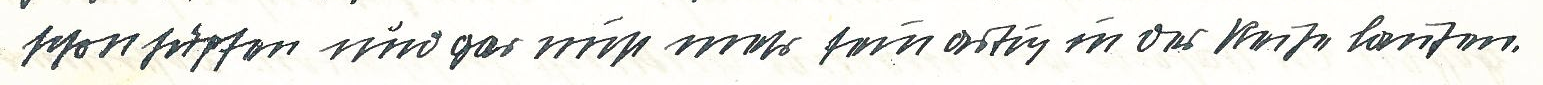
schon hüpfen und gar nicht mehr fein artig in der Reihe laufen.
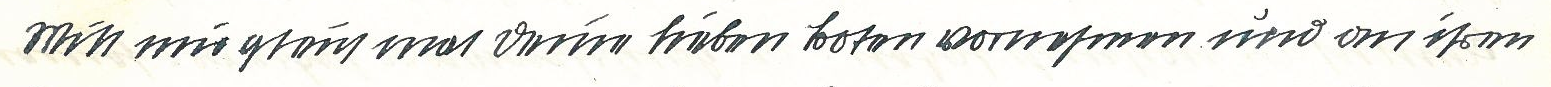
Will mir gleich mal Deine lieben Boten vornehmen und an ihren
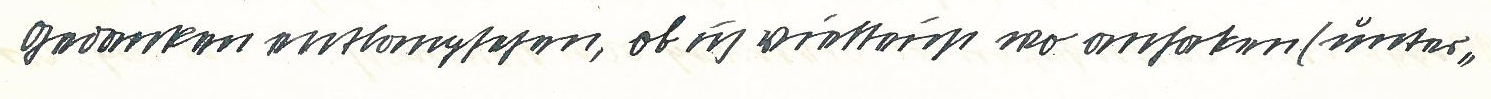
Gedanken entlangsehen, ob ich vielleicht wo anhaken (unter¬
